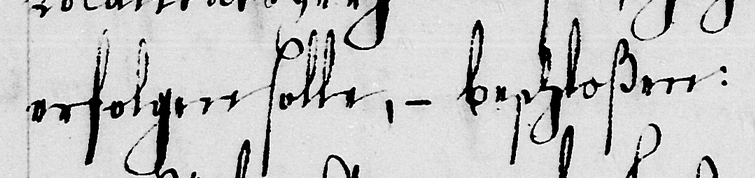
erfolgen solle,– beschloßen:
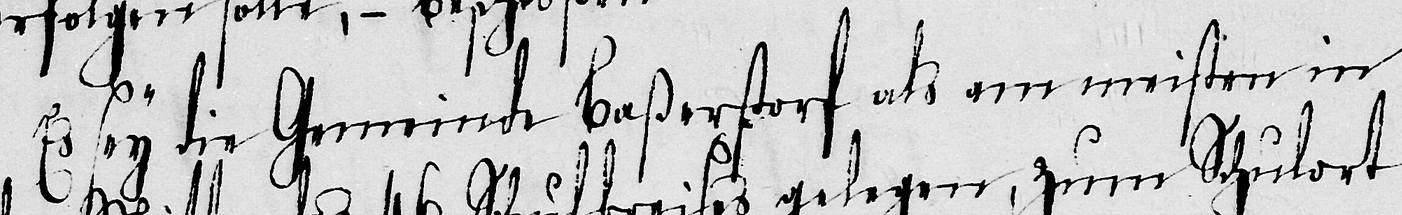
Es sey die Gemeinde Baßerstorf als am meisten in
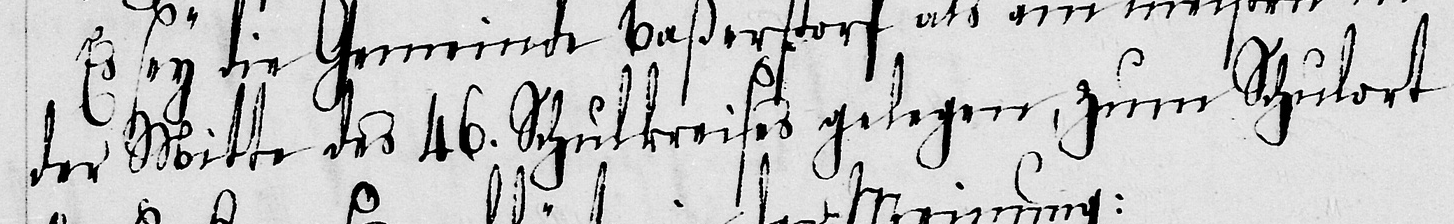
der Mitte des 46. Schulkreises gelegen, zum Schulort
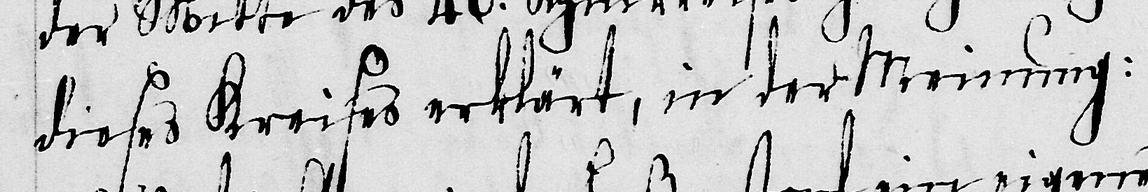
diese Kreises erklärt, in der Meinung:
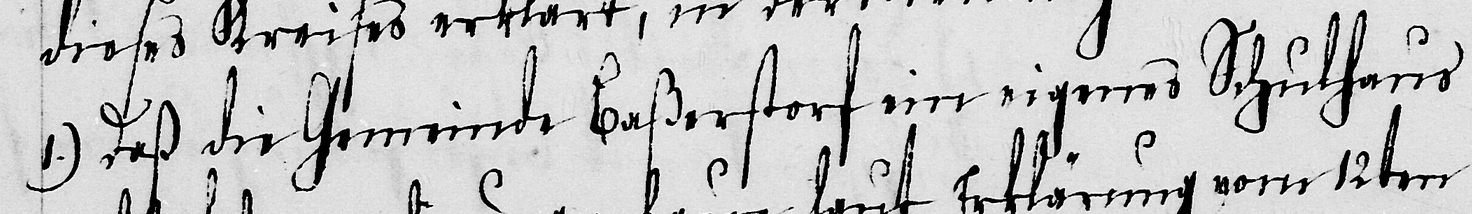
1.) Daß die Gemeinde Baßerstorf ein eigenes Schulhaus
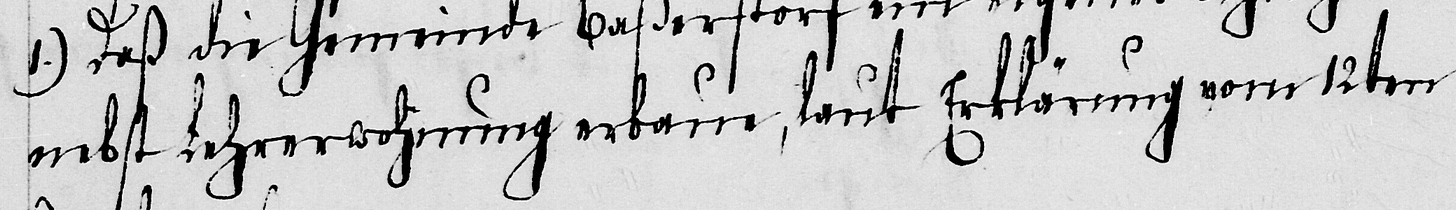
nebst Lehrerwohnung erbaue, laut Erklärung vom 12ten
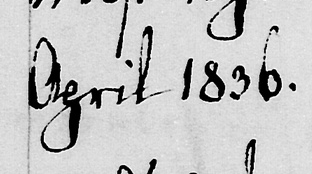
April 1836.
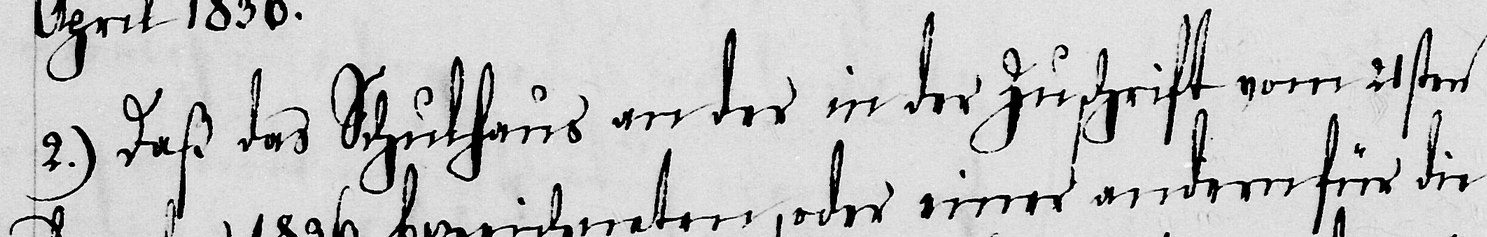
2.) Daß das Schulhaus an der in der Zuschrift vom 21sten
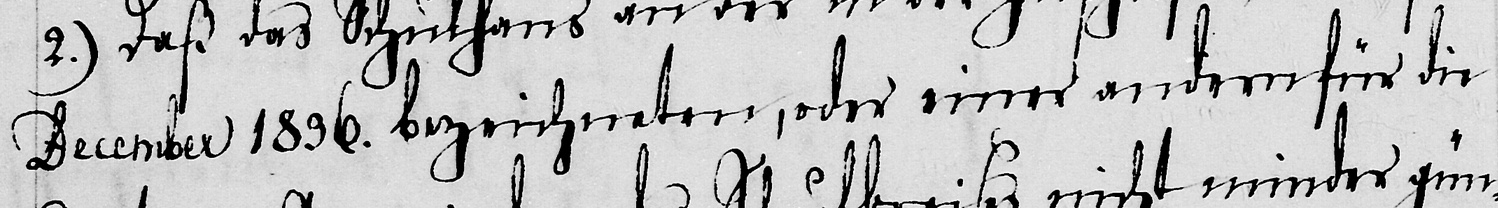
December 1836. bezeichneten, oder einer andern für die
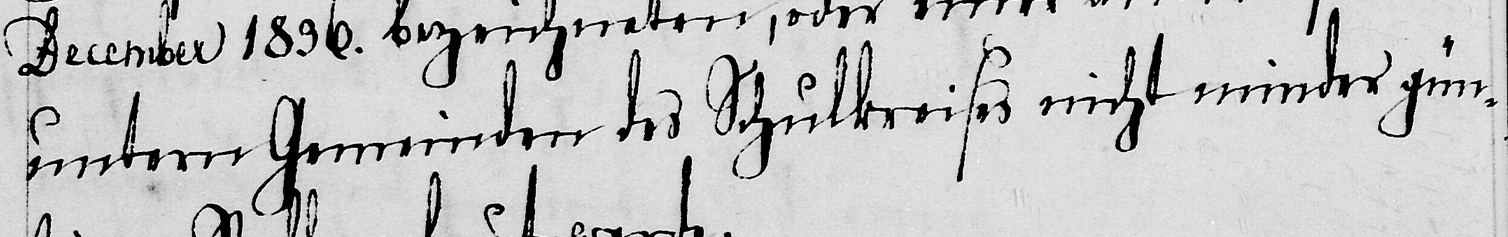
untern Gemeinden des Schulkreises nicht minder gün¬
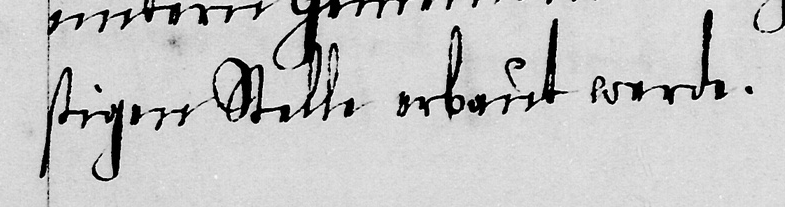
stigen Stelle erbaut werde.
